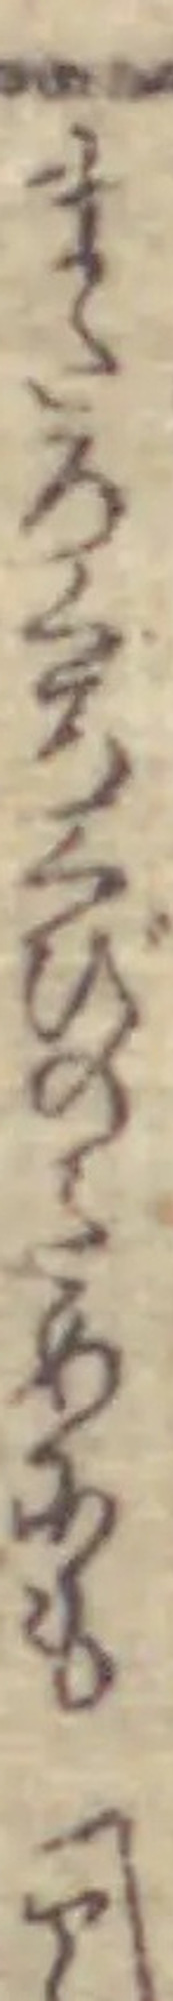またろくろくびのためにも
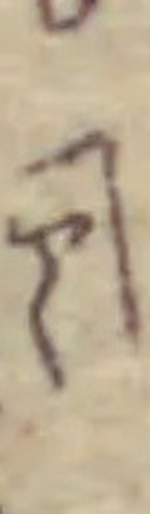〽アヽ
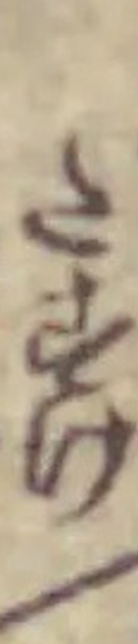たすけ
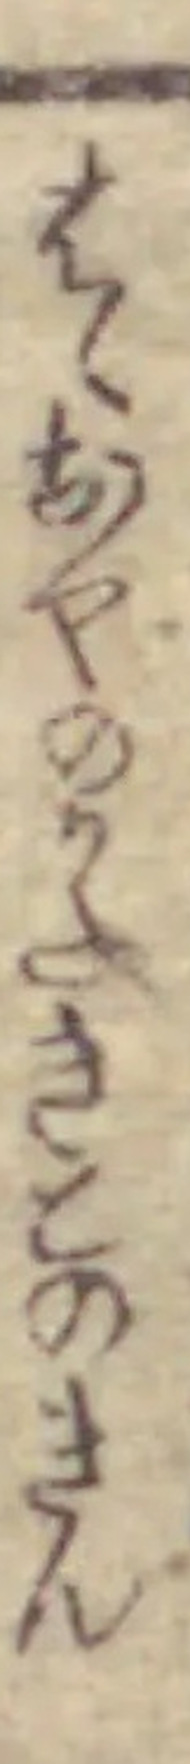はゝおやのかたきこのきん
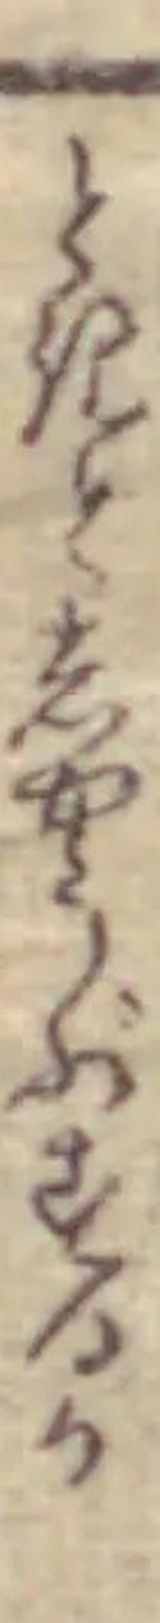ときとしやうぶするか
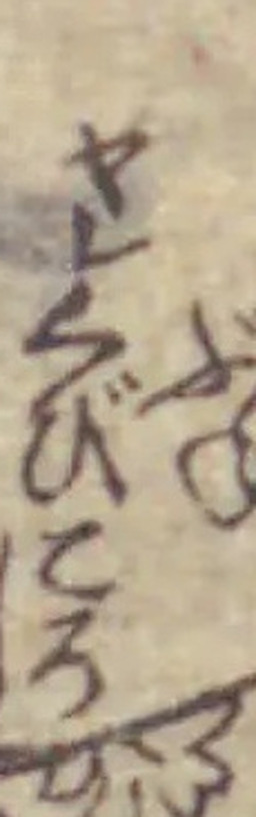ヤレくびころ
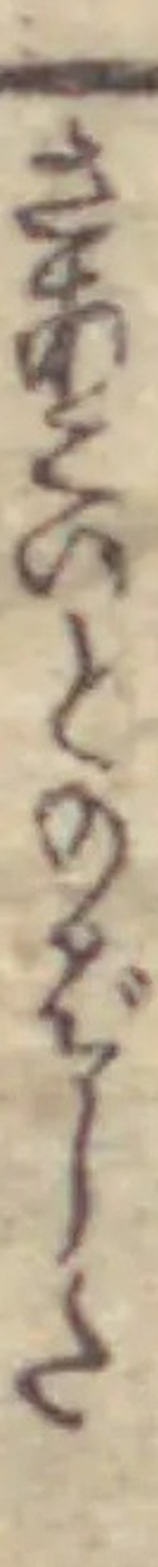さあこいとのばした
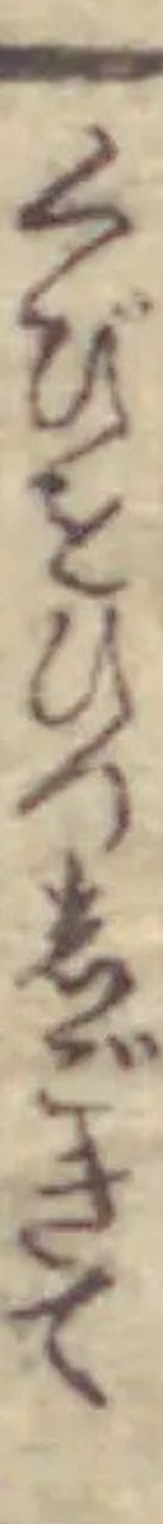くびをひつしごきて
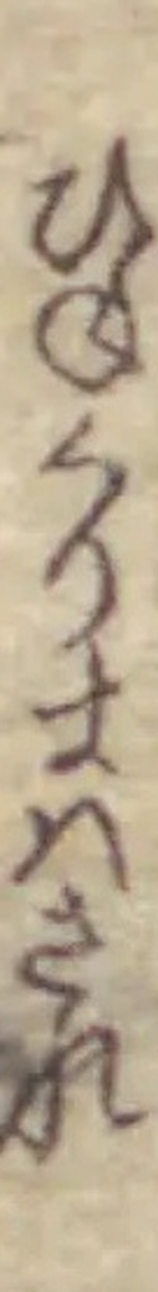ひねくりまはされ
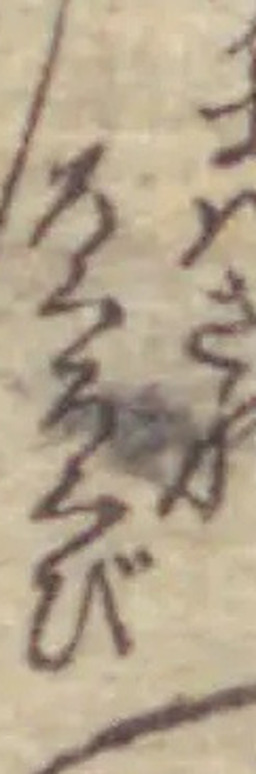ろくろくび
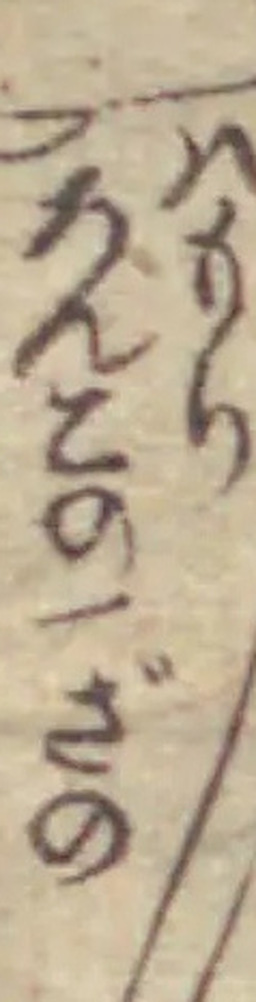ろんこの一ざの
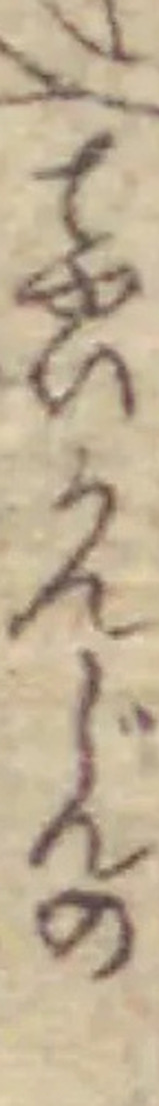てやいかんじんの
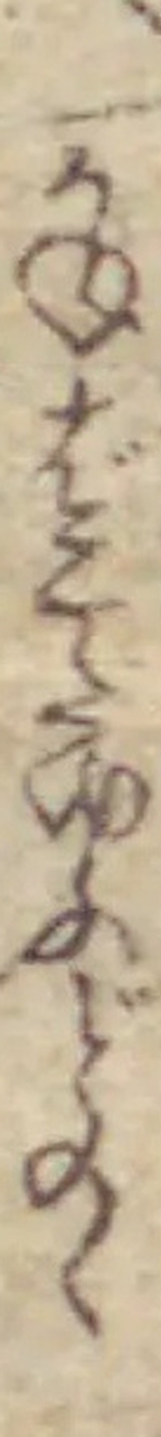かねばこたゆふどのゝ
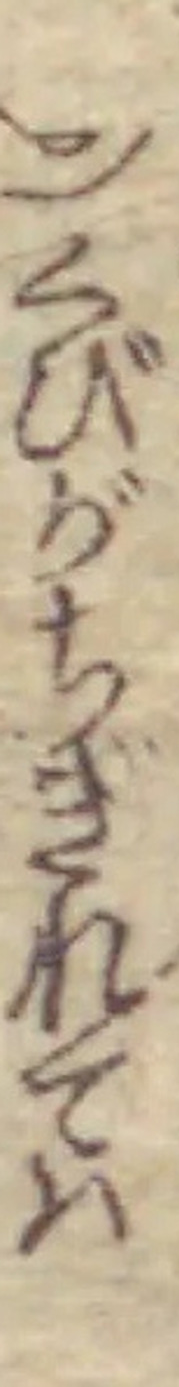くびがちぎれては
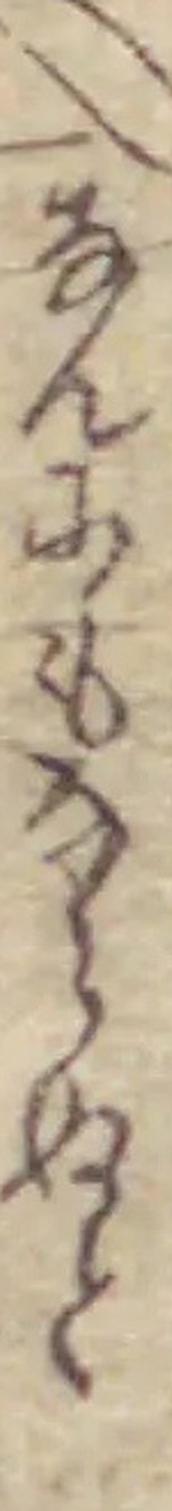なんにもならぬと
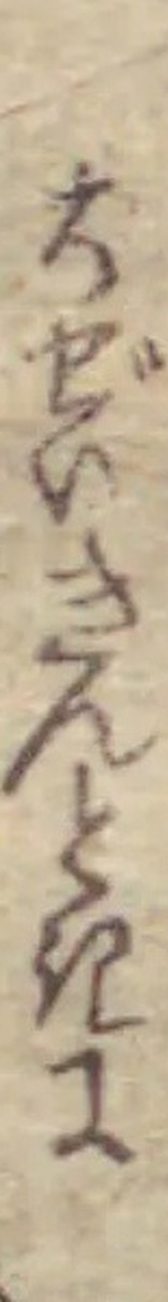大ぜいきんときに
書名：化物敵討 2巻
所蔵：国立国会図書館 National Diet Library, JAPAN
